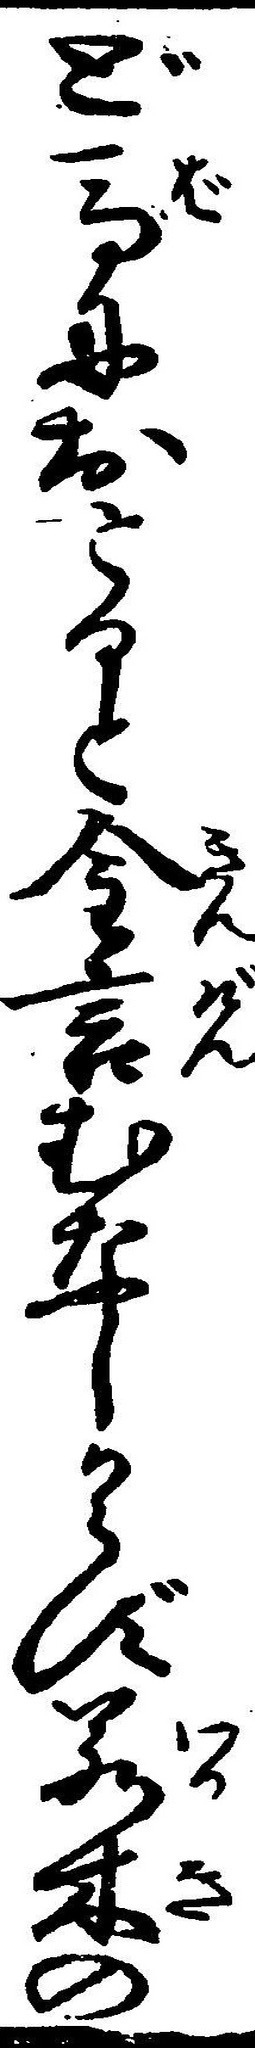ど馬におとると金言むなしからず若木の
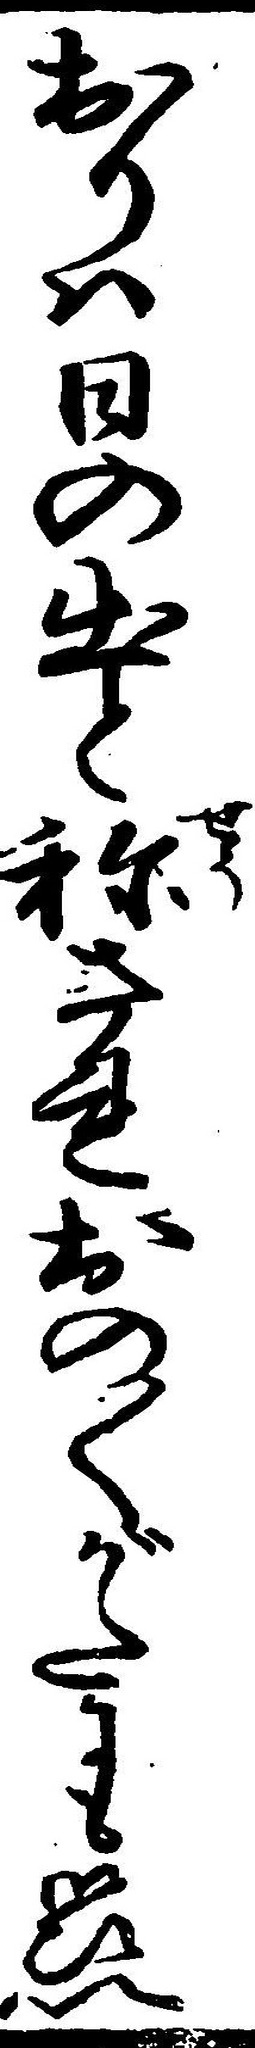おりは日の出と称されおの〳〵がたにも御ひい
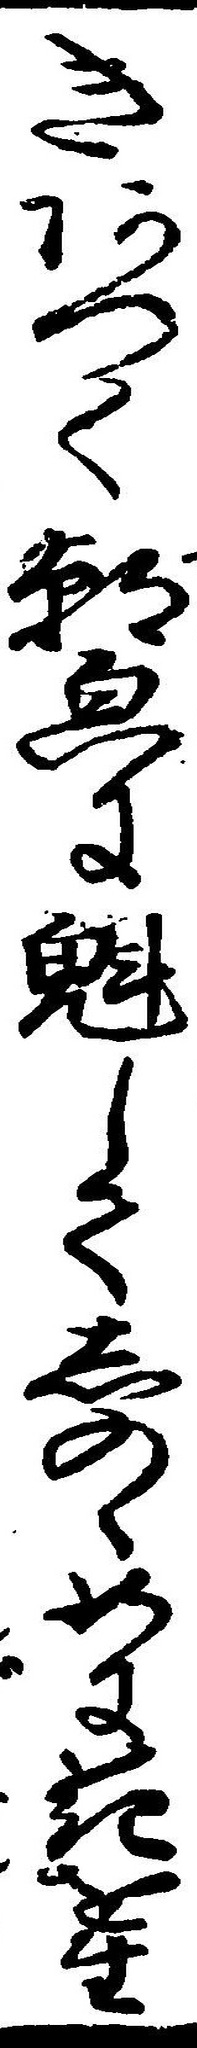きあつく朝貌に魁してしのゝめに花を生
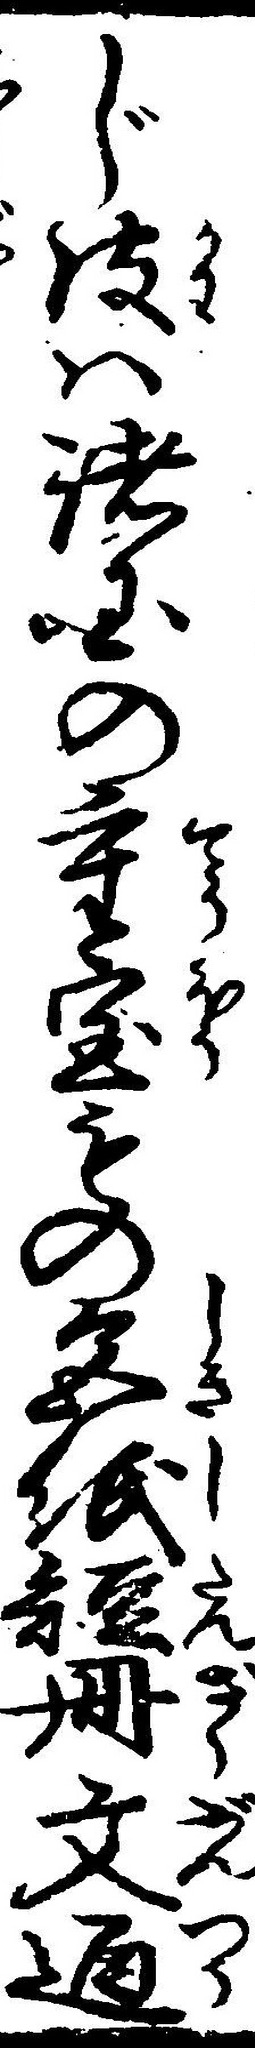じ皮は諸国の重宝もの色紙短冊文通
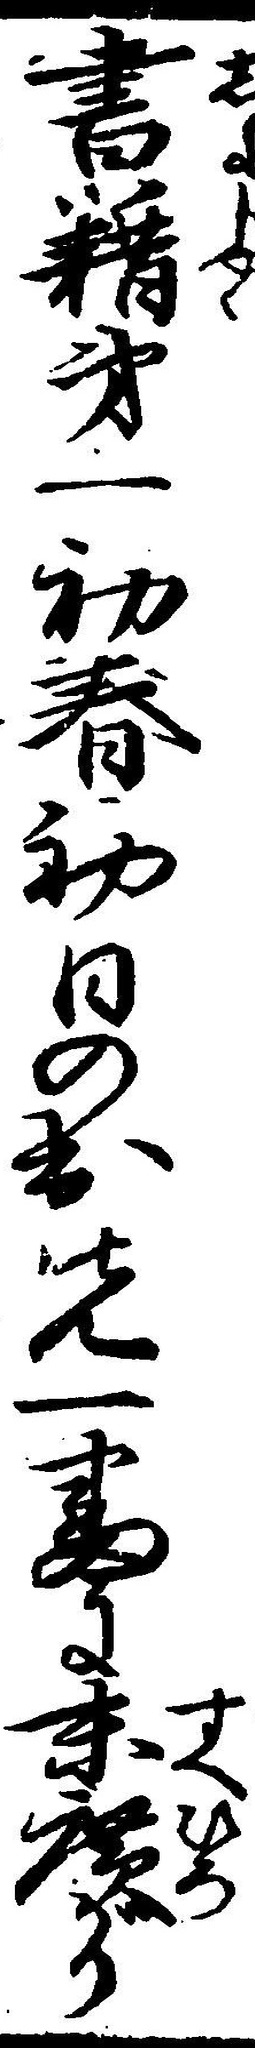書籍第一初春初日の出先一番に末広がり
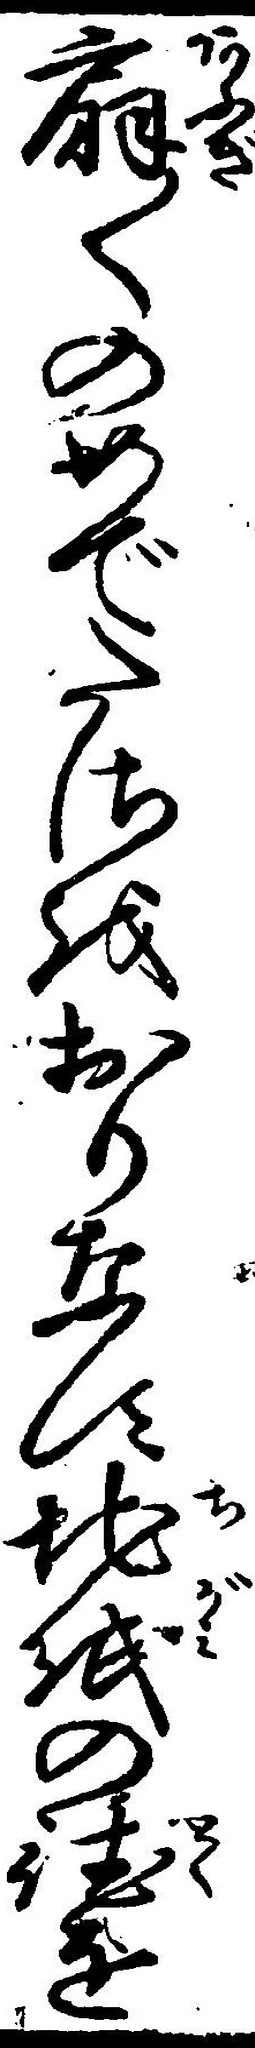扇〳〵のめでたさをおりなす地紙の徳を
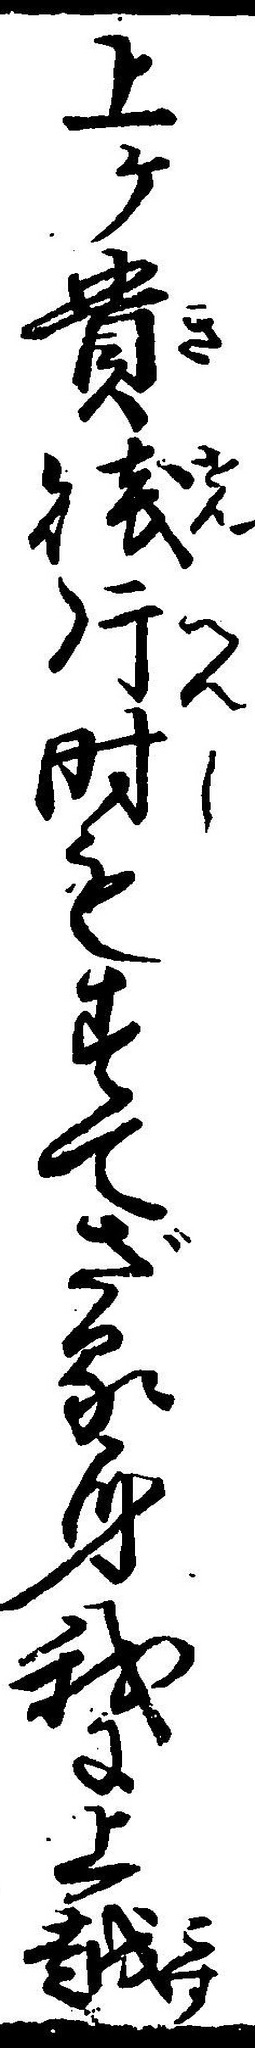上貴賎片時もすてざる身我に上越
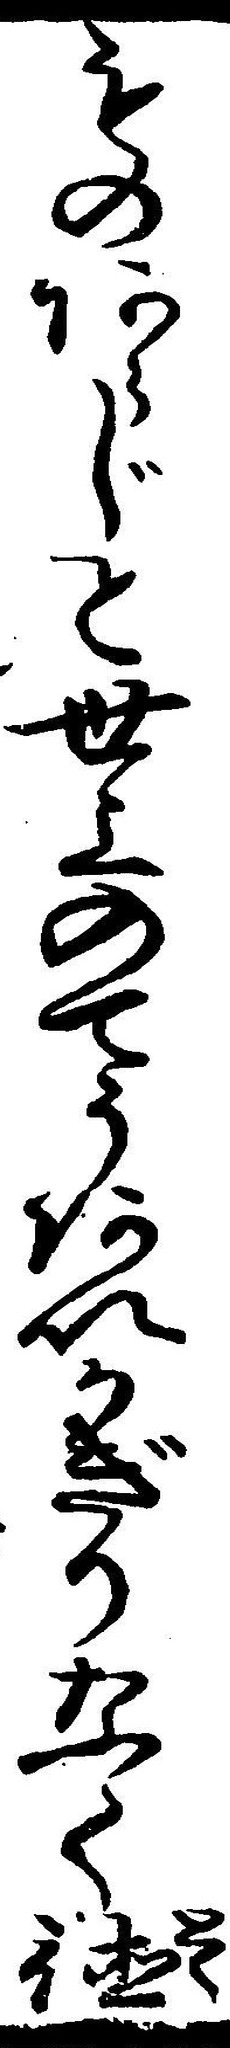ものあらじと世上のてうあいかぎりなく徳
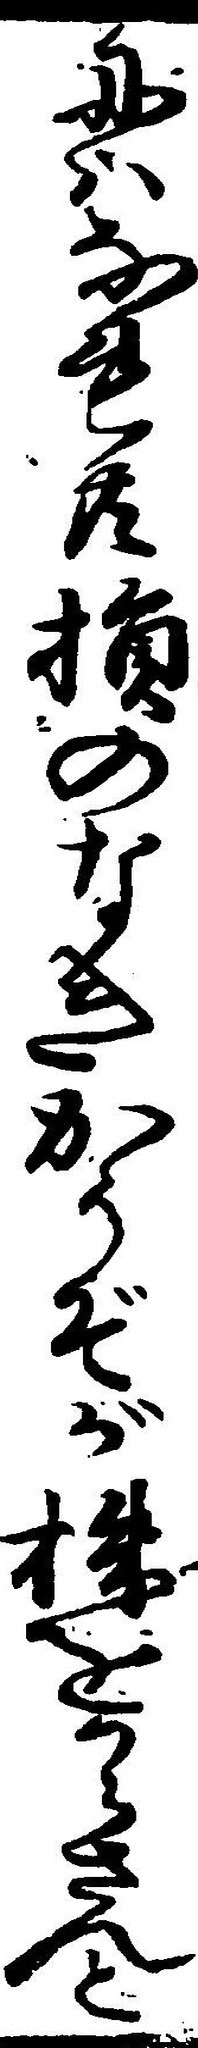にはなれ共損のないかうぞが株をからさんと

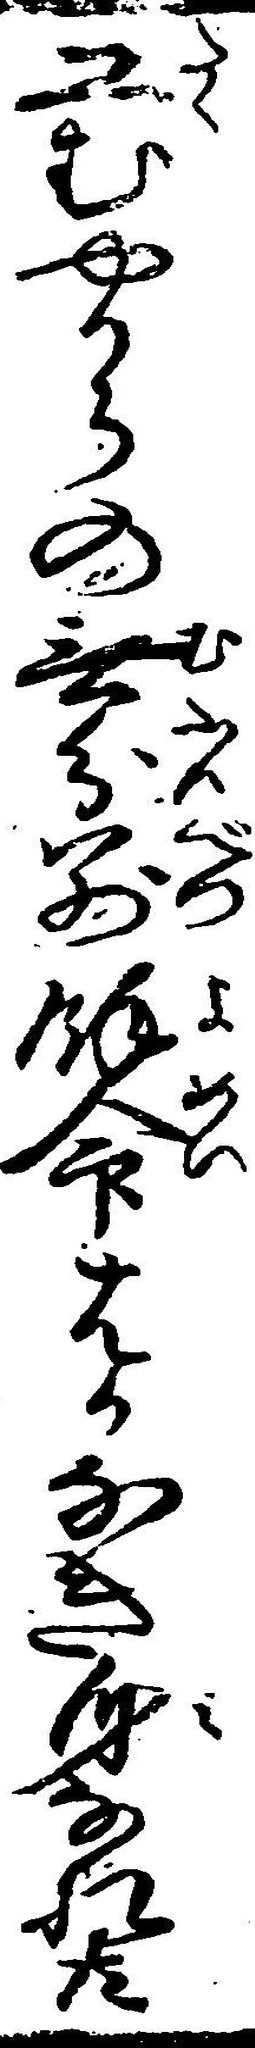工むやからの無分別余命はかなき身なれ共
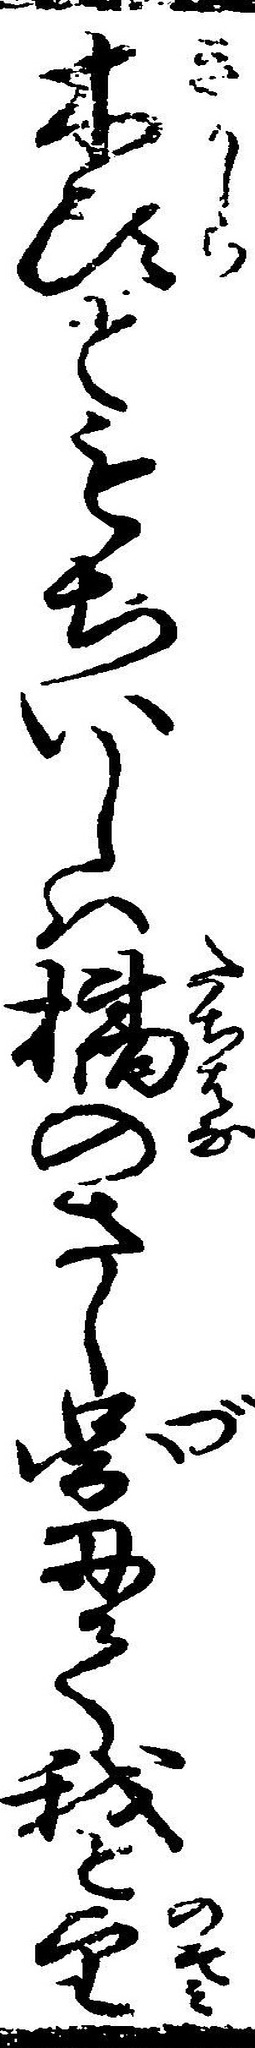木頭ともちいしは橘のさし図にて我と望
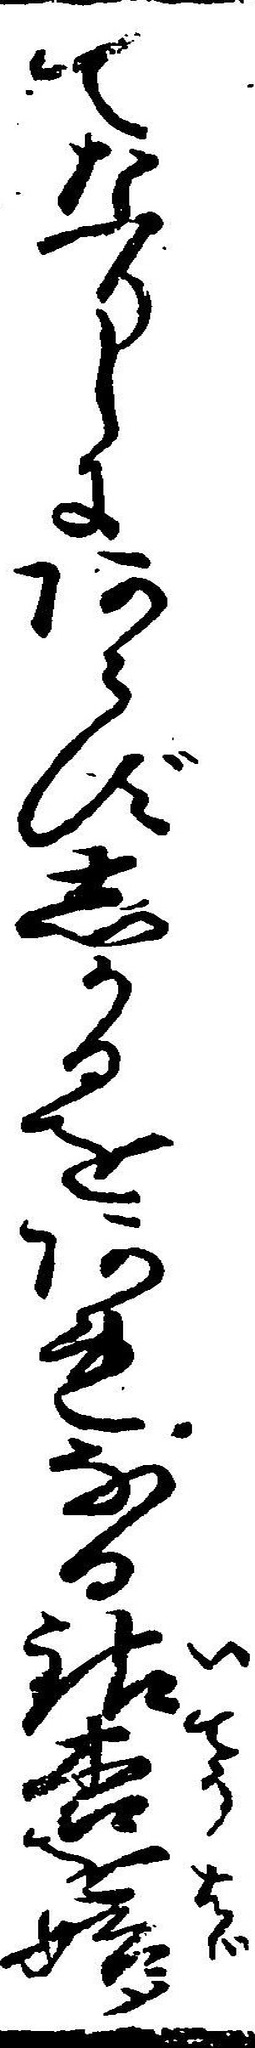てなりしにあらずしかるをあれなる銀杏を始
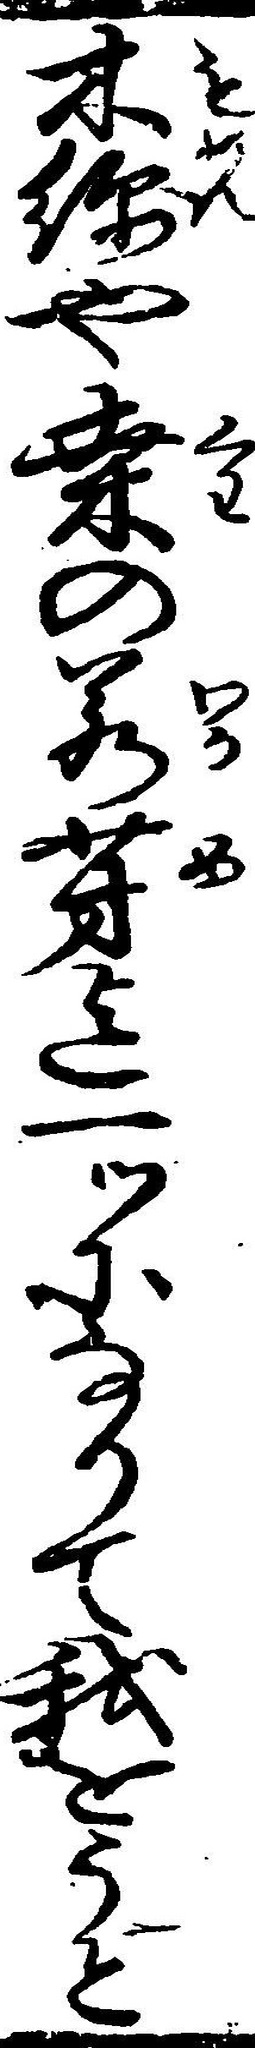木綿や桑の若芽迄一ッになりて我をうと
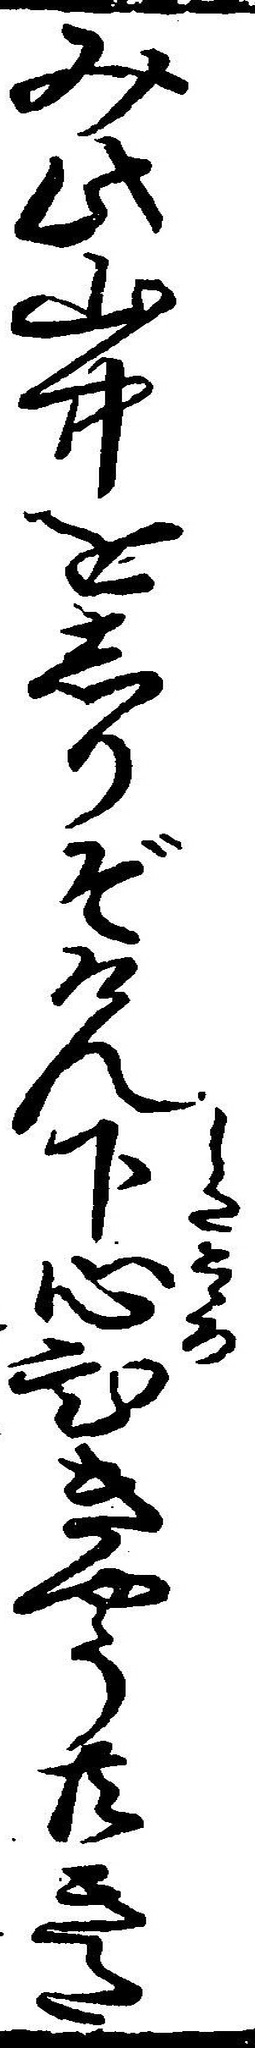み此山中をしりぞけん下心ひきやう共きた
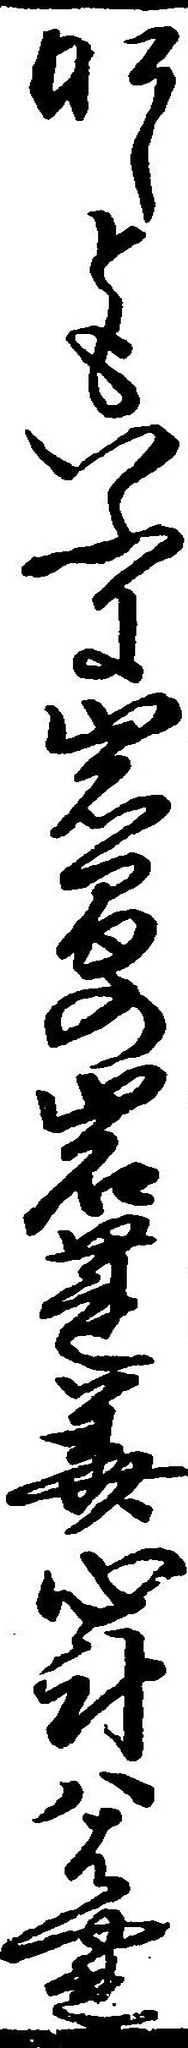なしともいふに岩間の岩蓮華心斗ははやれ
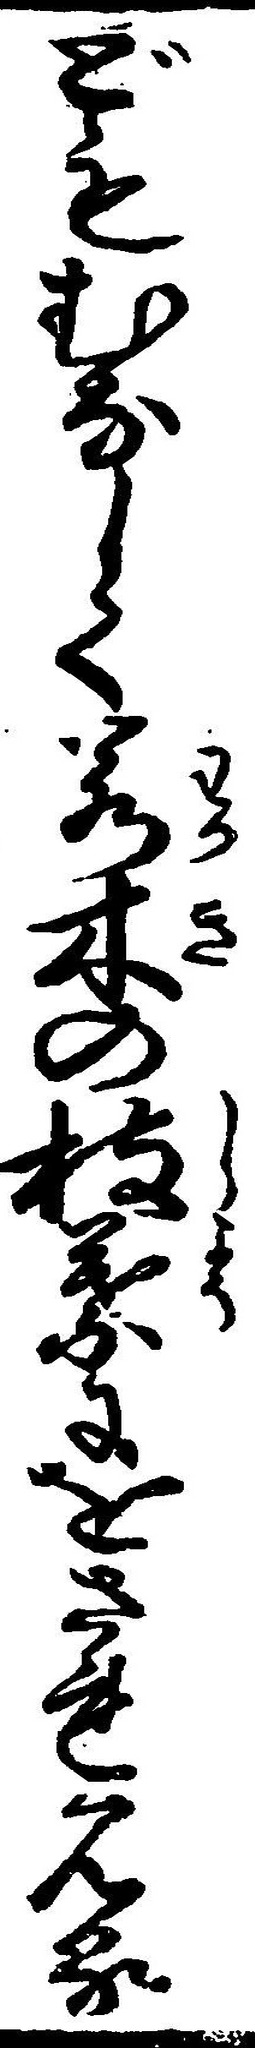どもむなしく若木の枝葉にをされ見る
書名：草木芝居化物退治 / 泉花堂三蝶(十六兵衛)作
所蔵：東京大学総合図書館 General Library in the University of Tokyo, JAPAN
